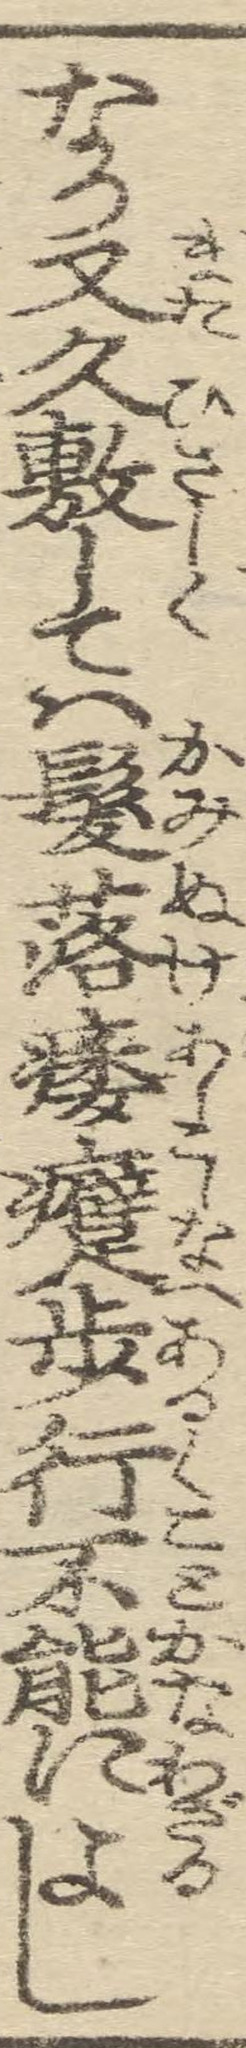なり又久敷しては髪落痿癖足歩行不能によし
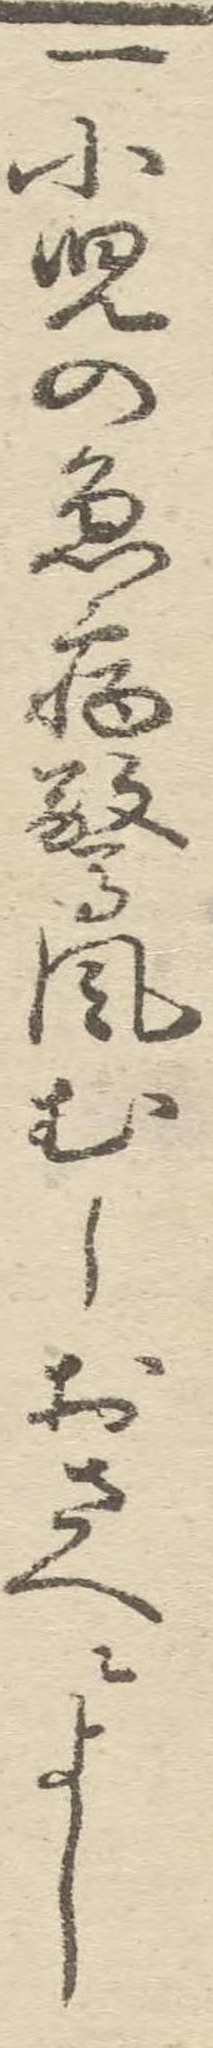一小児の急病驚風むしおさへニよし
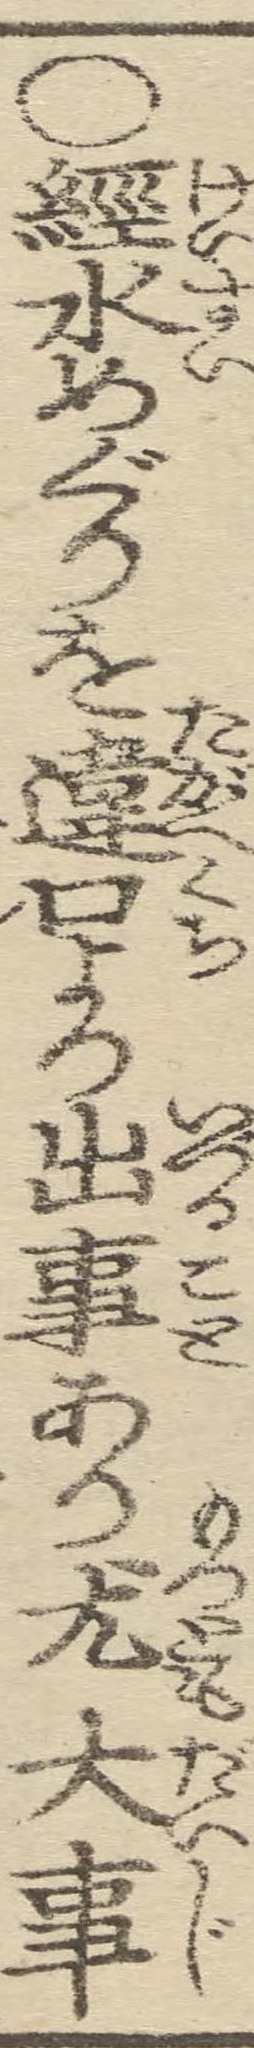○経水めぐりを違口より出事あり尤大事
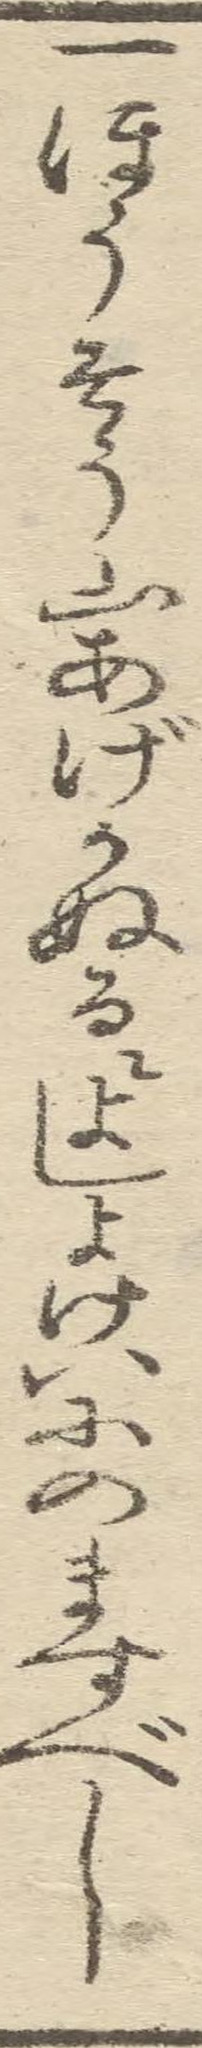一ほうそう山あげかねるニよしよけいにのますべし
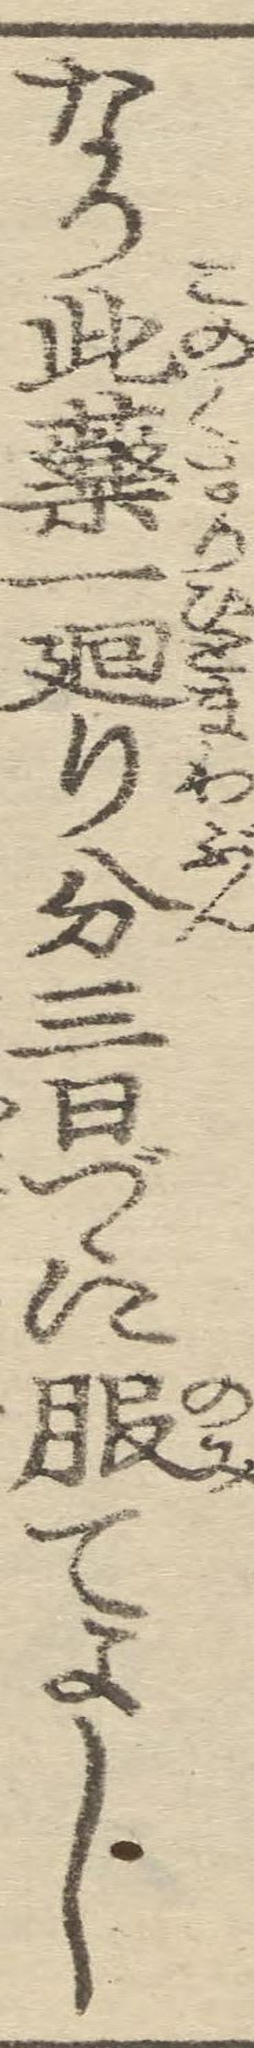なり此薬一廻り分三日づゝに服てよし
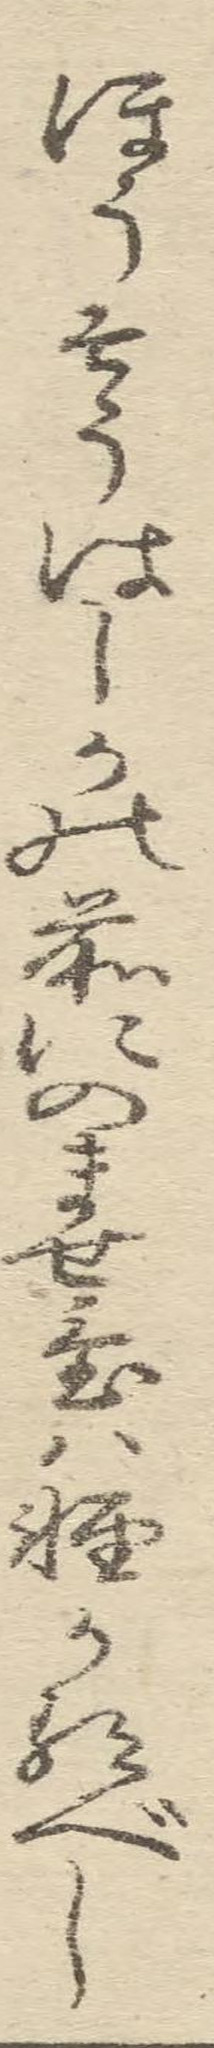ほうそうはしかの前にのませ置は軽かるべし
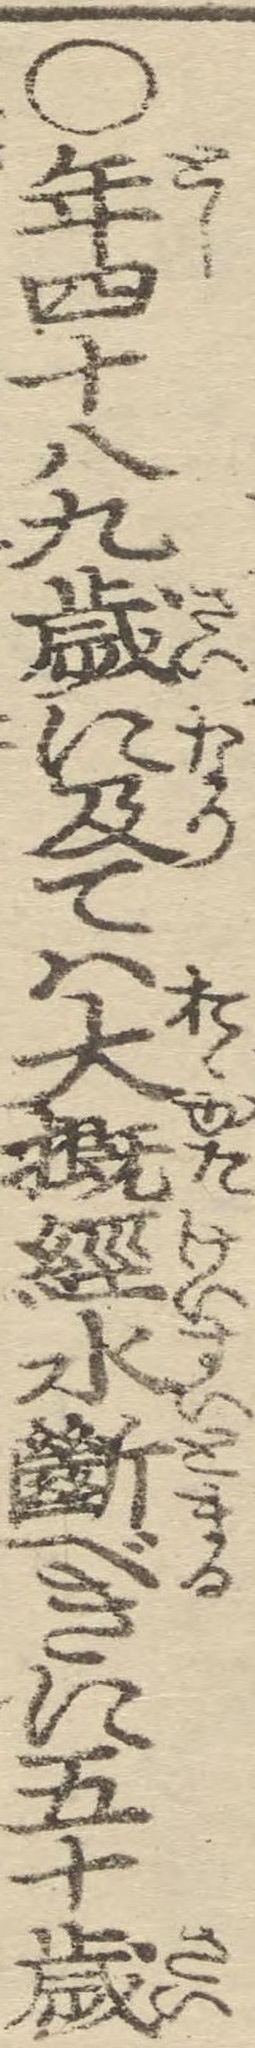○年四十八九歳に及ては大概経水断べきに五十歳
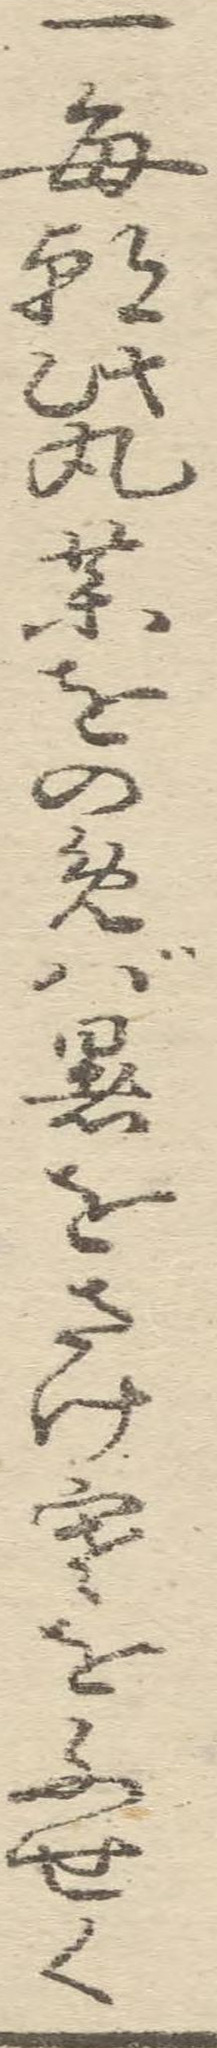一毎朝此丸薬をのめば暑をさけ寒をふせく
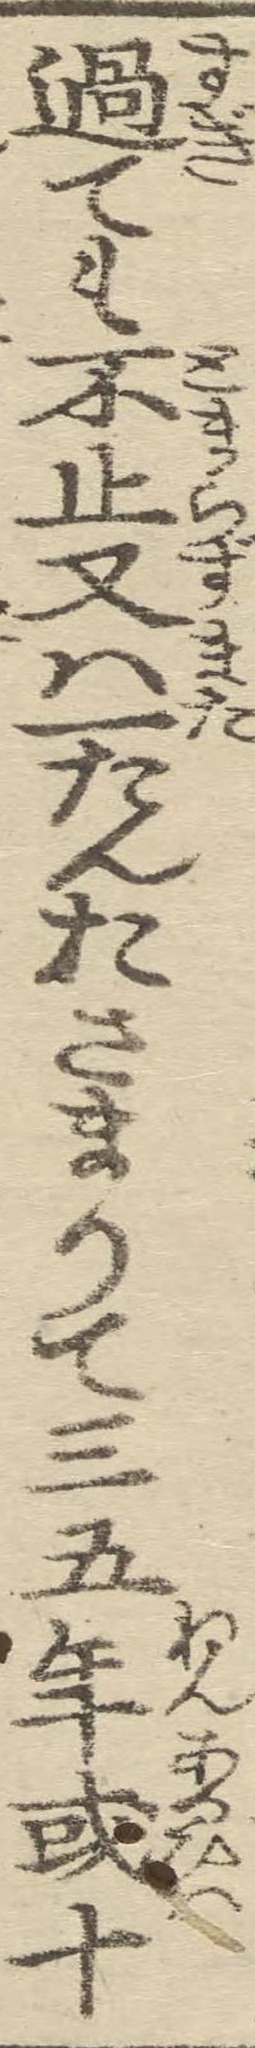過ても不止又は一たんおさまりて三五年或十
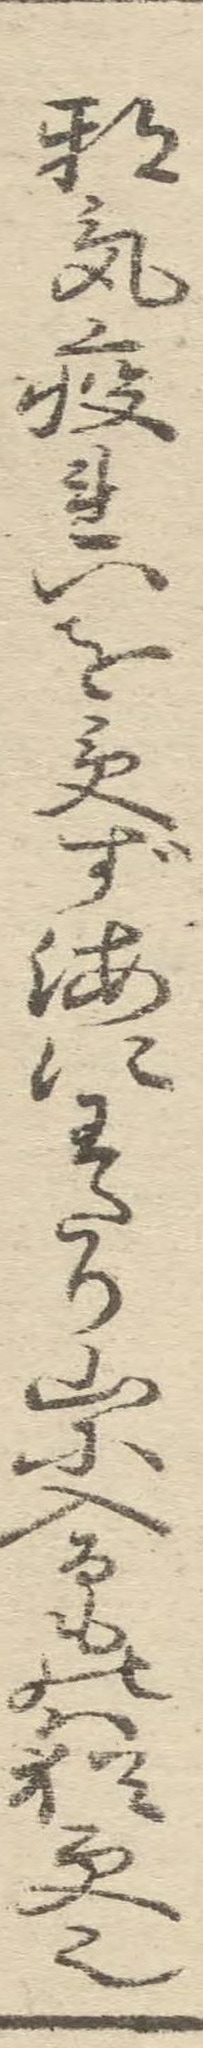邪気疫れいを受ず海にわたり山に入るものは猶更也
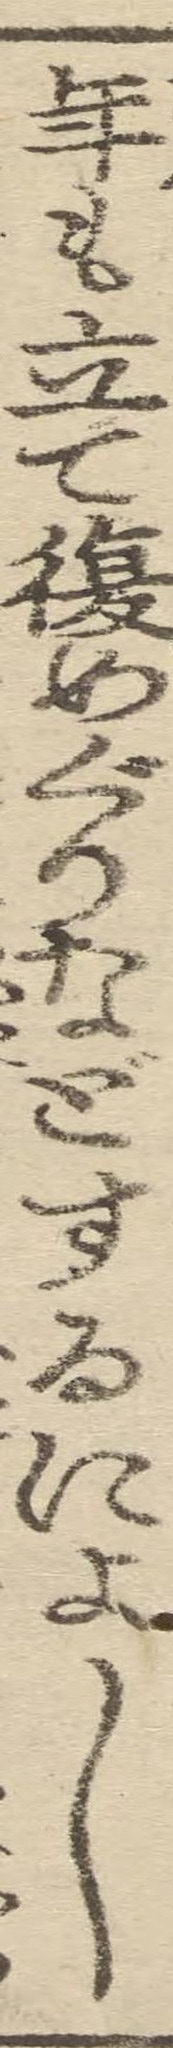年も立て復めぐりなどするによし
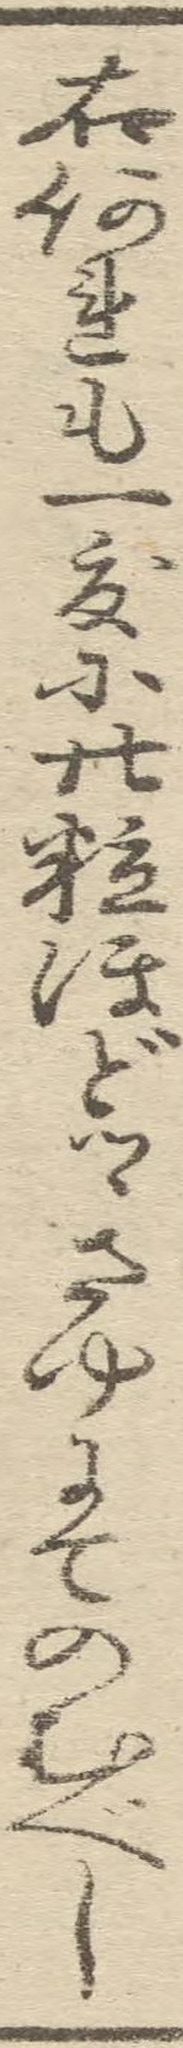右何れも一度に廿粒ほどツヽさゆにてのむべし
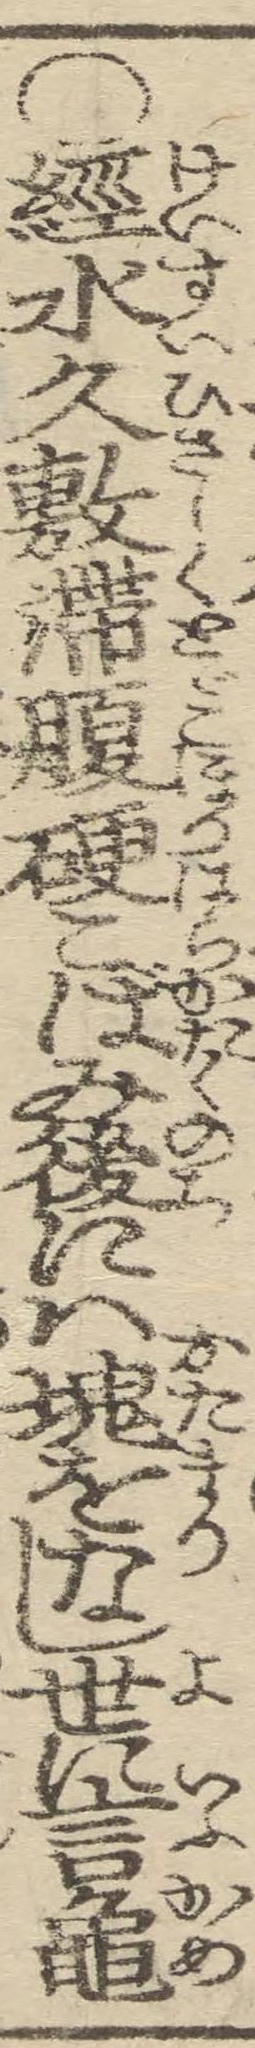○経水久敷滞腹硬こばみ後には塊をなし世に言亀
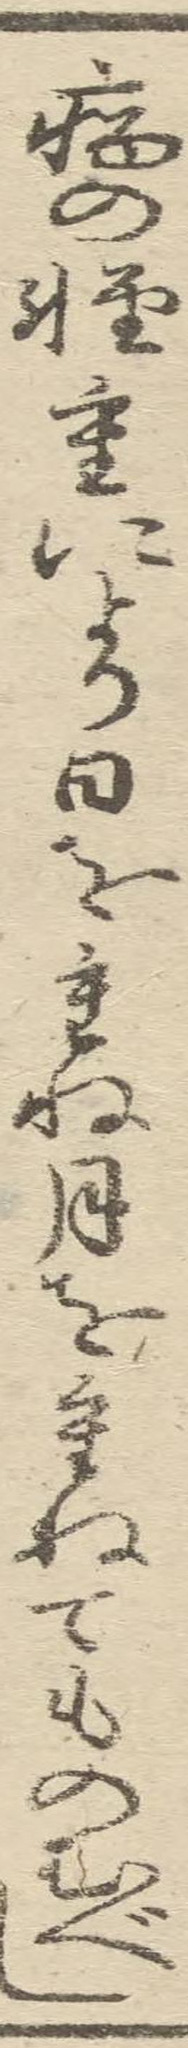病の軽重により日を重ね月を重ねてものむべし
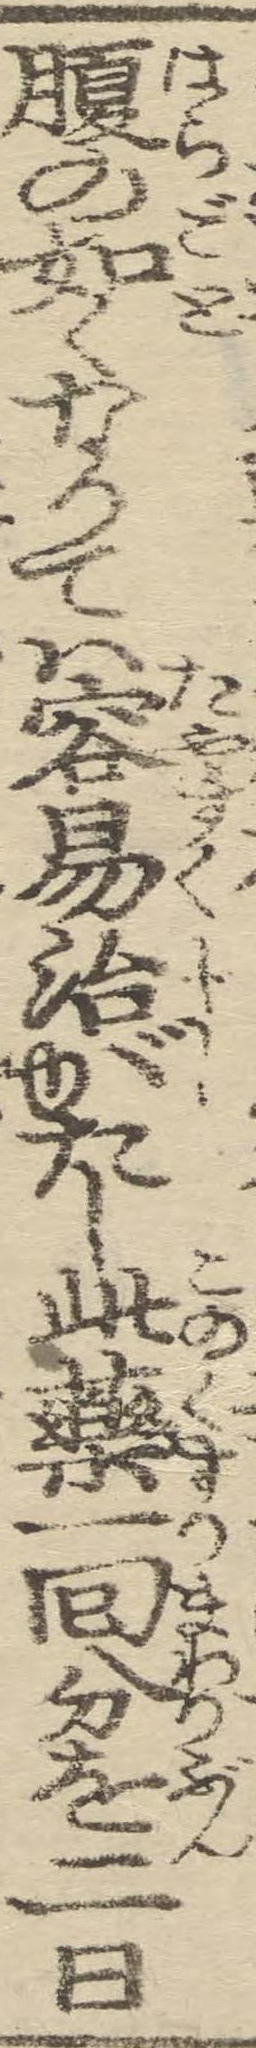腹の如くなりては容易治がたし此薬一回分を二日
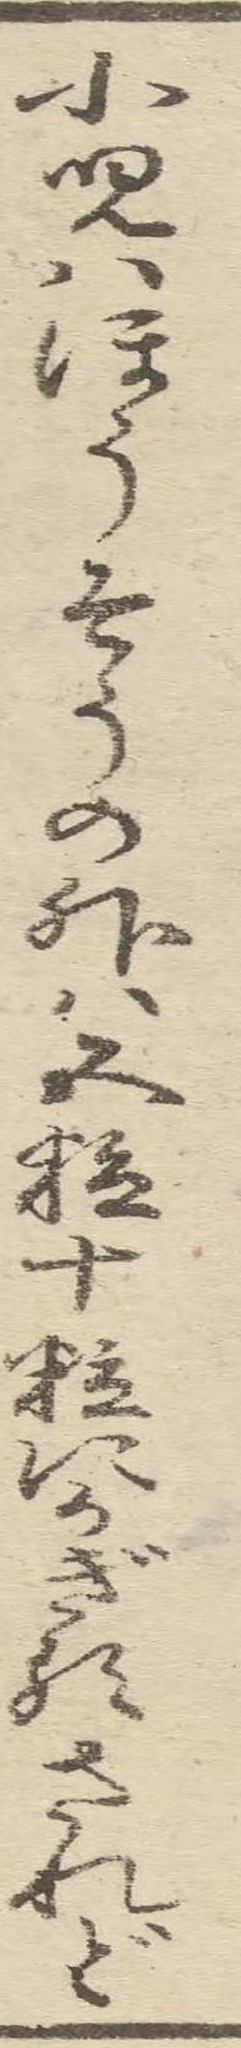小児はほうそうの外は五粒十粒にかぎるされど
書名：浪華薬種問屋能書張交帖. 二
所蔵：国立国会図書館 National Diet Library, JAPAN
